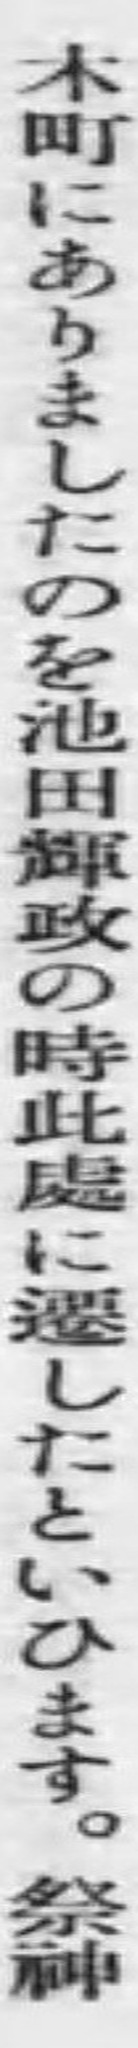木町にありましたのを池田輝政の時此処に遷したといひます。祭神
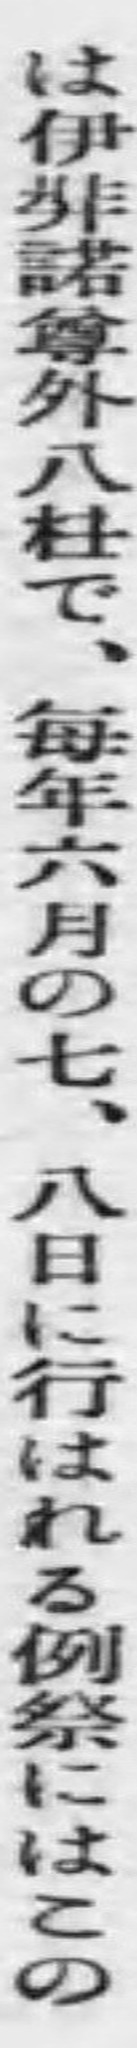は伊弉諾尊外八柱で、毎年六月の七、八日に行はれる例祭にはこの
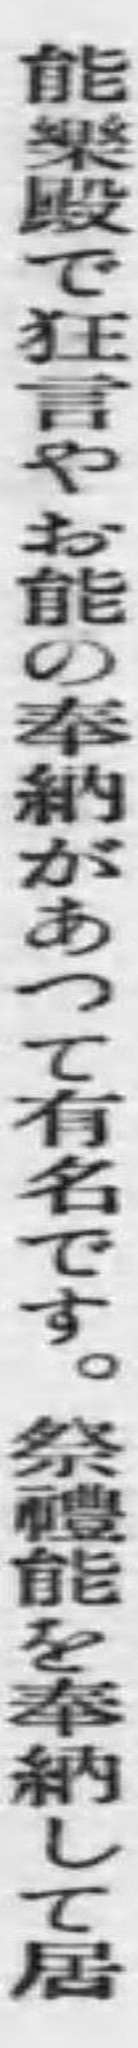能楽殿で狂言やお能の奉納があつて有名です。祭礼能を奉納して居
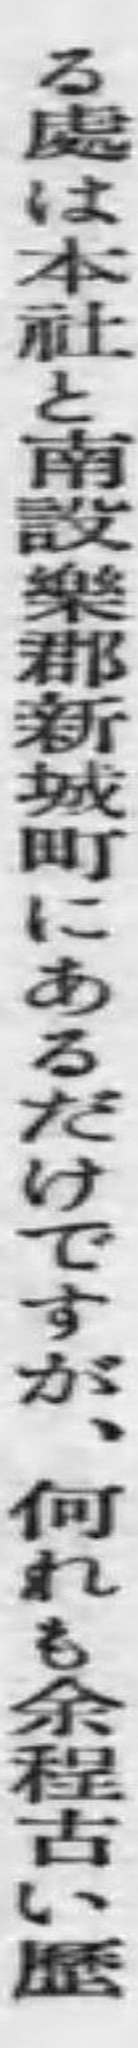る処は本社と南設楽郡新城町にあるだけですが、何れも余程古い歴
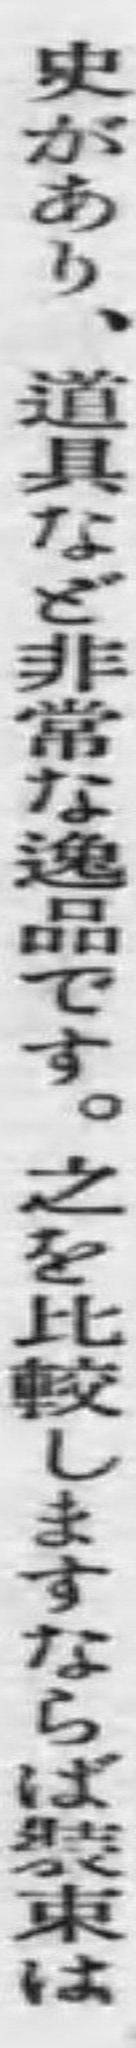史があり、道具など非常な逸品です。之を比較しますならば装束は
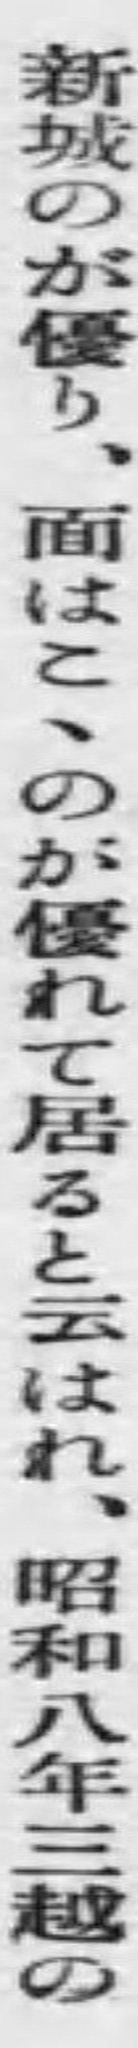新城のが優り、面はこゝのが優れて居ると云はれ、昭和八年三越の
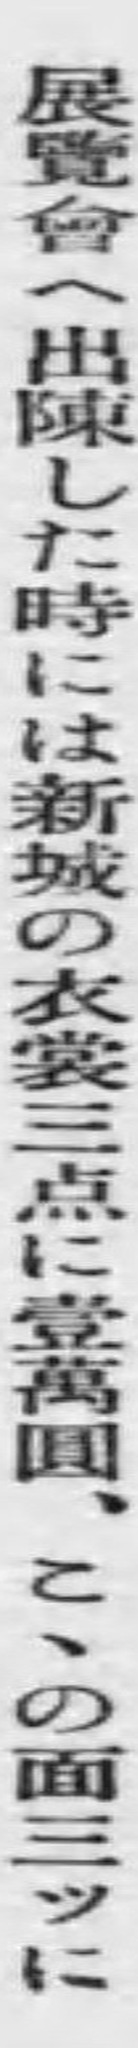展覧会へ出陳した時には新城の衣裳三点に壱万円、こゝの面三ッに
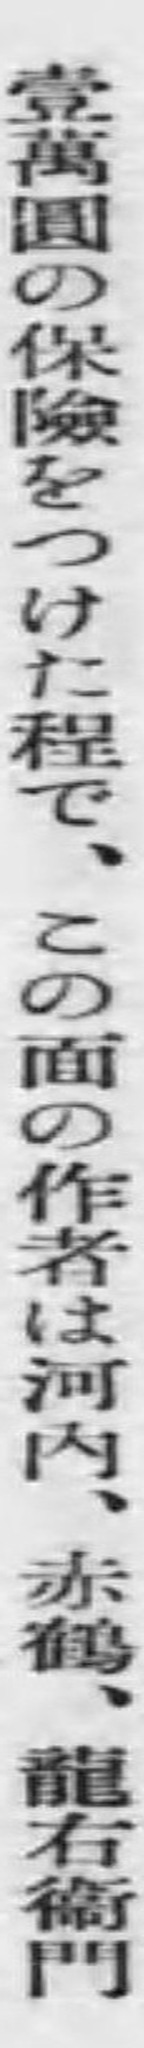壱万円の保険をつけた程で、この面の作者は河内、赤鶴、龍右衛門
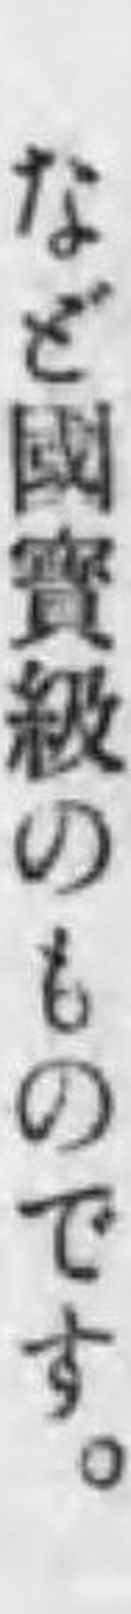など国宝級のものです。
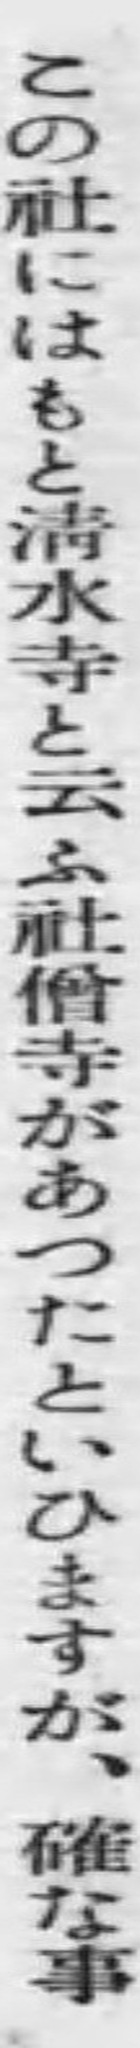この社にはもと清水寺と云ふ社僧寺があつたといひますが、確な事
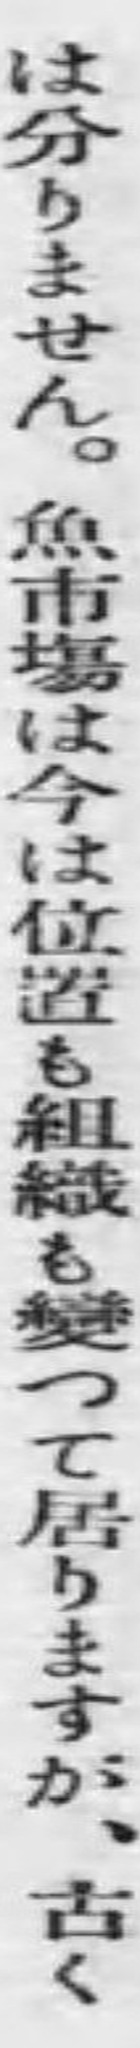は分りません。魚市場は今は位置も組織も変つて居りますが、古く
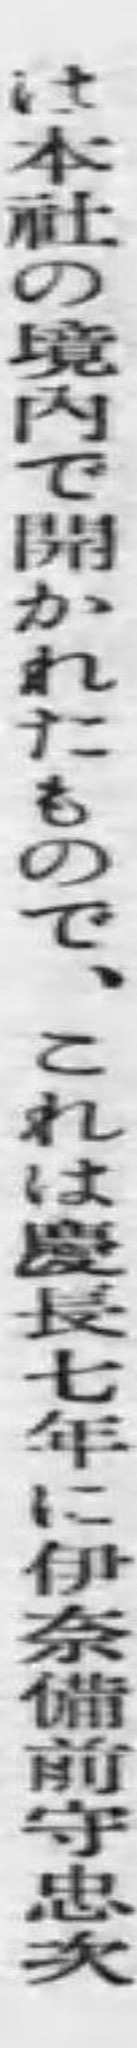は本社の境内で開かれたもので、これは慶長七年に伊奈備前守忠次
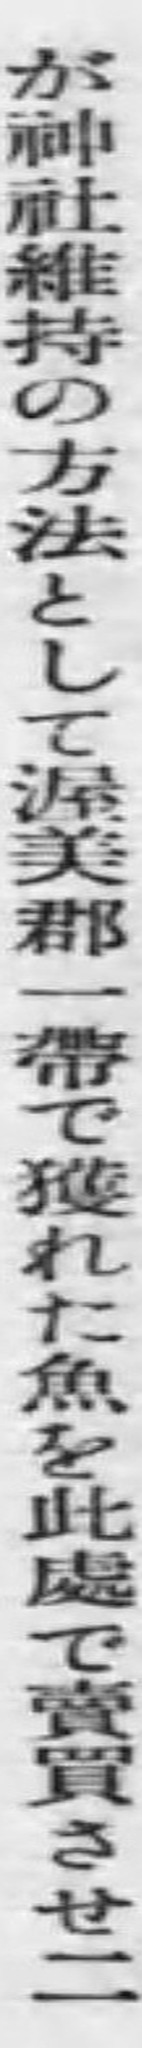が神社維持の方法として渥美郡一帯で獲れた魚を此処で売買させ二
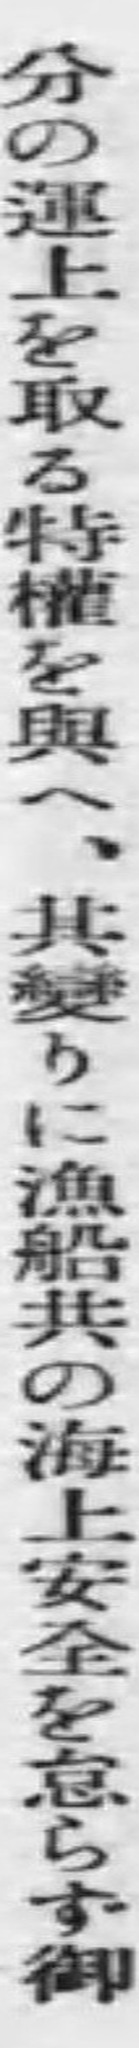分の運上を取る特権を与へ、其変りに漁船共の海上安全を怠らず御
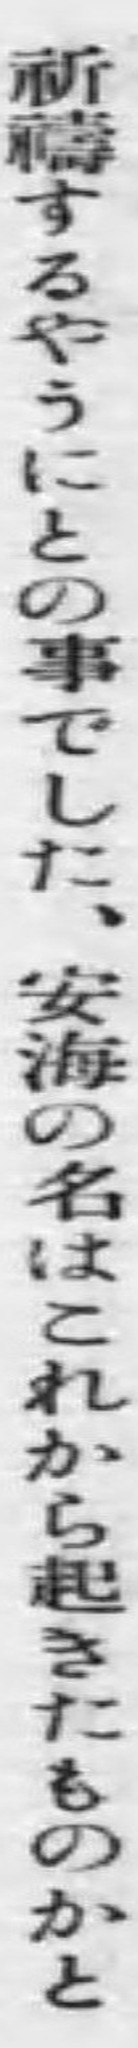祈祷するやうにとの事でした、安海の名はこれから起きたものかと
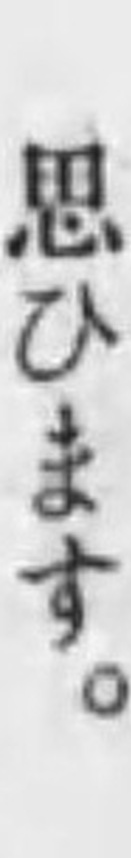思ひます。
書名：東三河道中記 : 豊橋市及其附近案内
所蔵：国立国会図書館 National Diet Library, JAPAN
